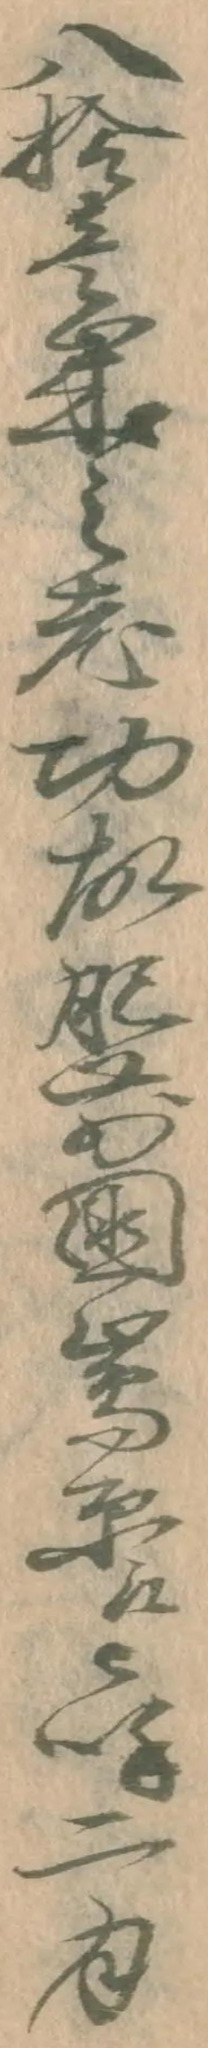八拾壱歳之老功故肥前国島原江被呼二月
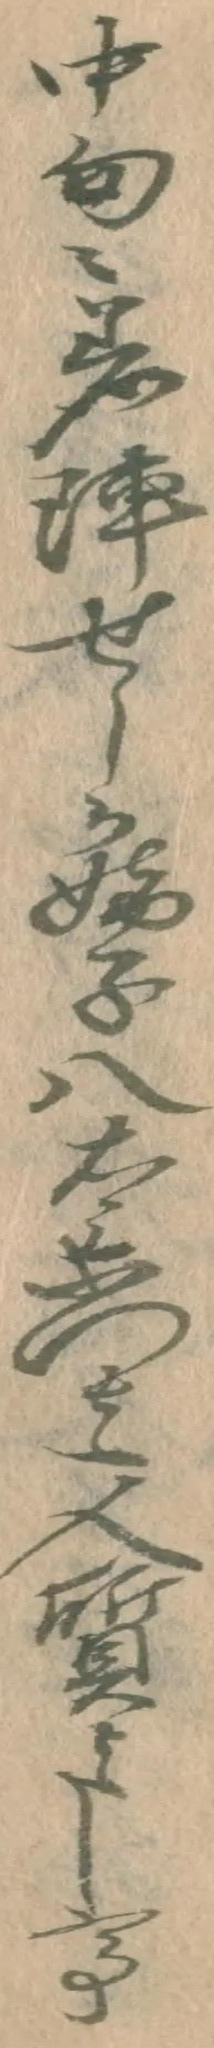中旬に着陣せしか嫡子八右衛門者人質与し亭
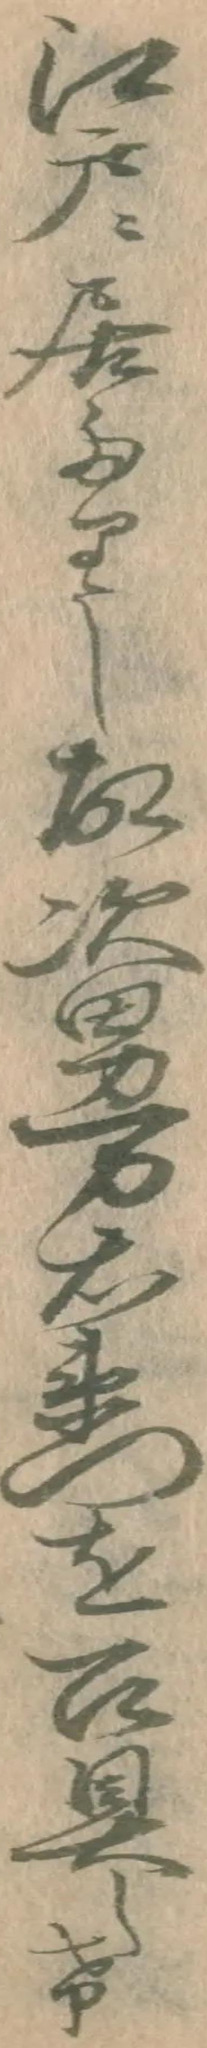江戸に居多里て故次男万右衛門を召具し希
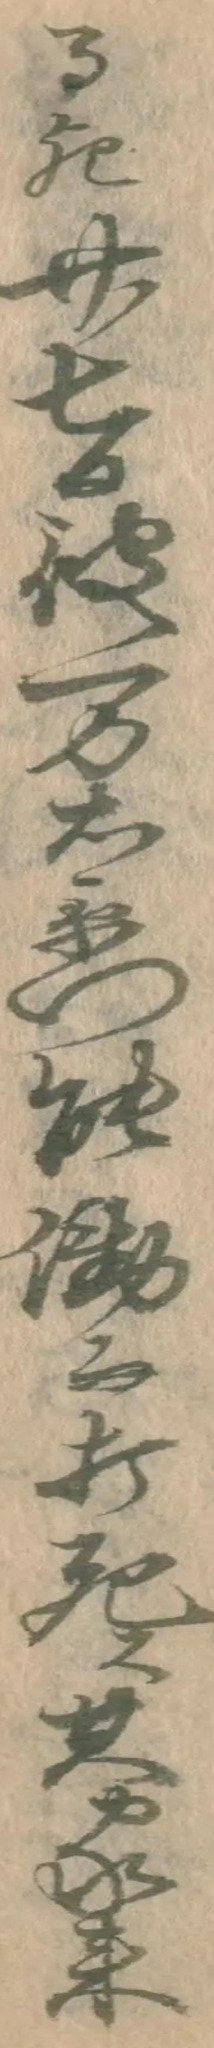る歟廿七日彼万右衛門能働而打死す其家来
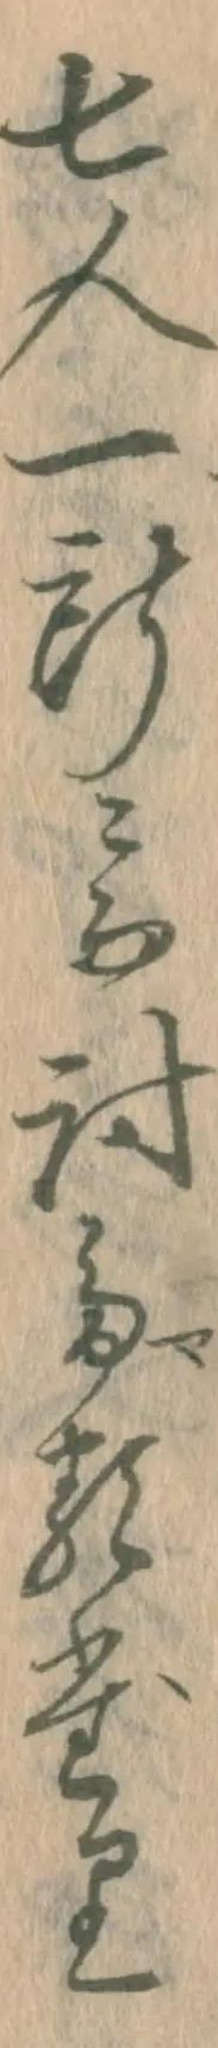七人一所に而討多類堂里
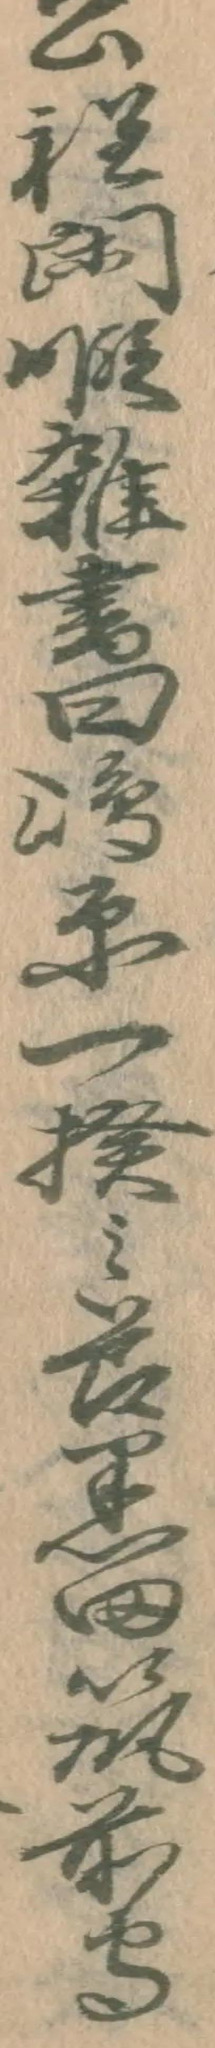公程閑暇雑書曰島原一揆之節黒田筑前守
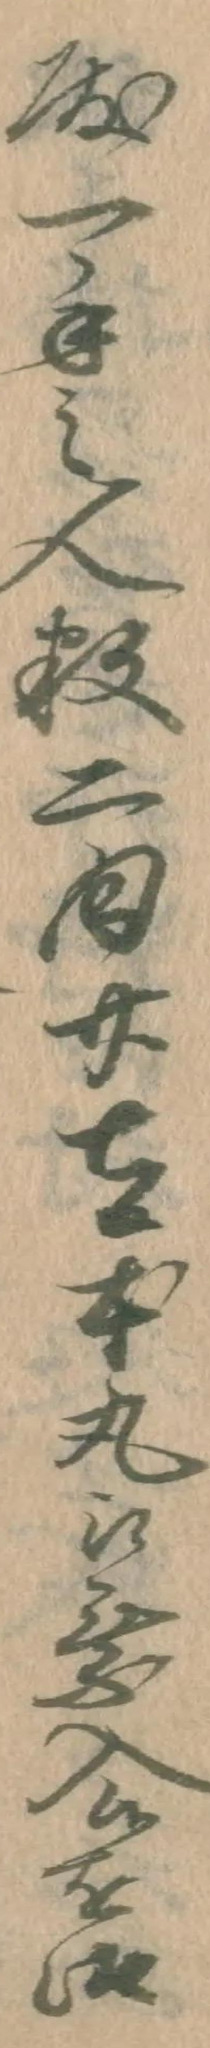殿一手之人数二月廿七日本丸江乗入候を御
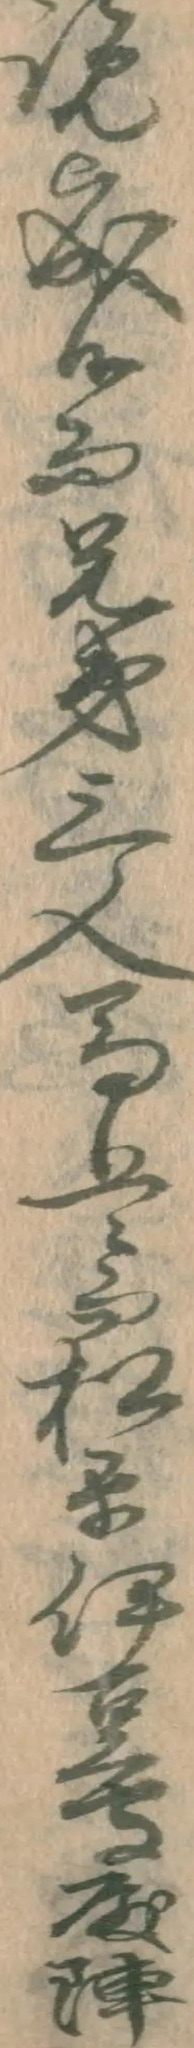覧被成候而兄弟三人馬上に而松平伊豆守殿陣
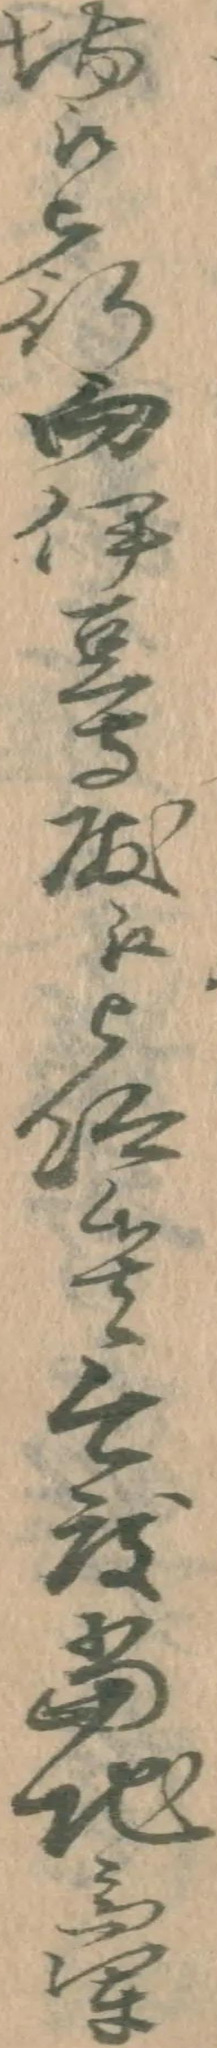場江被行向伊豆守殿江被仰候者今度当地に而軍
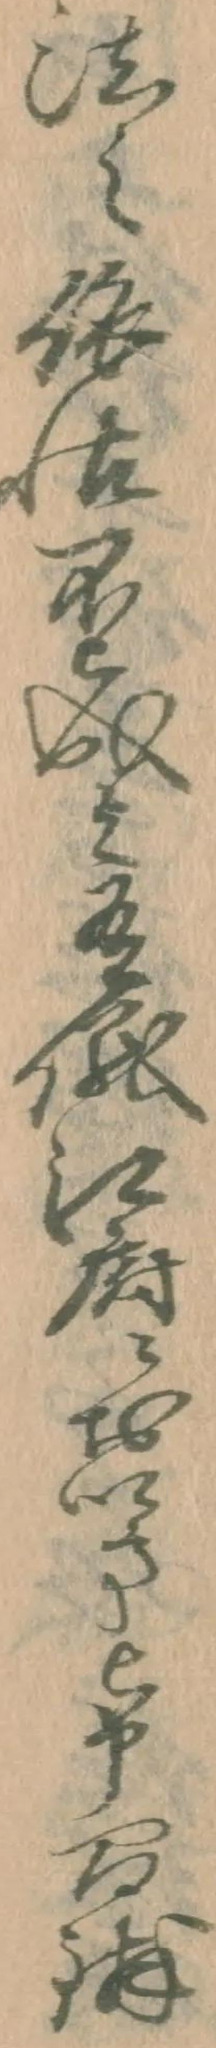法之依怙不被成者有儀江府にお以亭被申間鋪
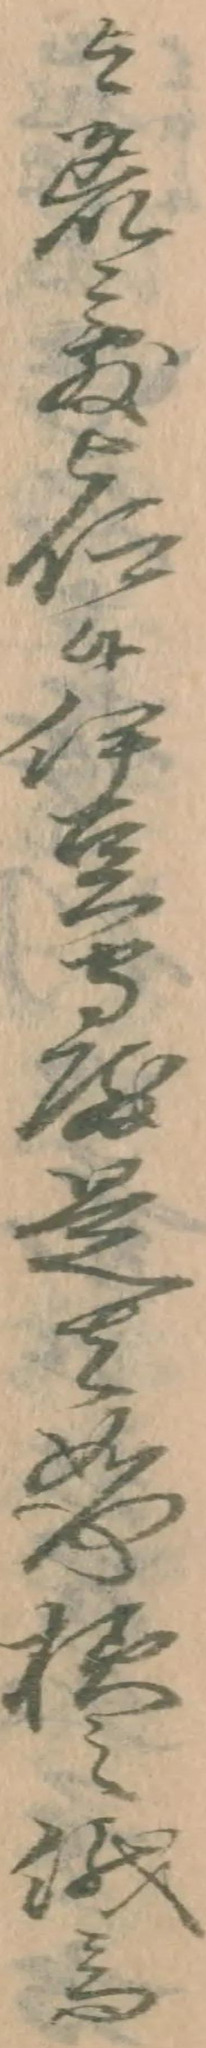与荒々敷被仰候伊豆守殿是者如何様之儀に而
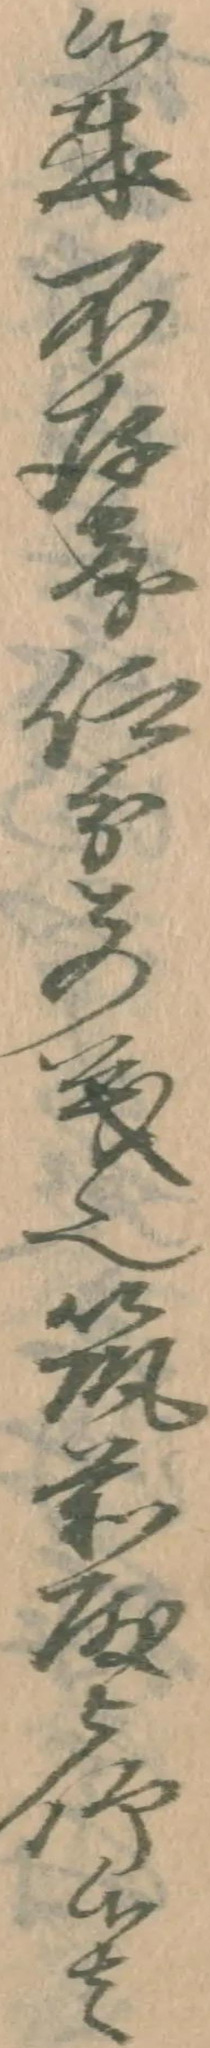候成不存寄仰分との義也筑前殿被仰候者
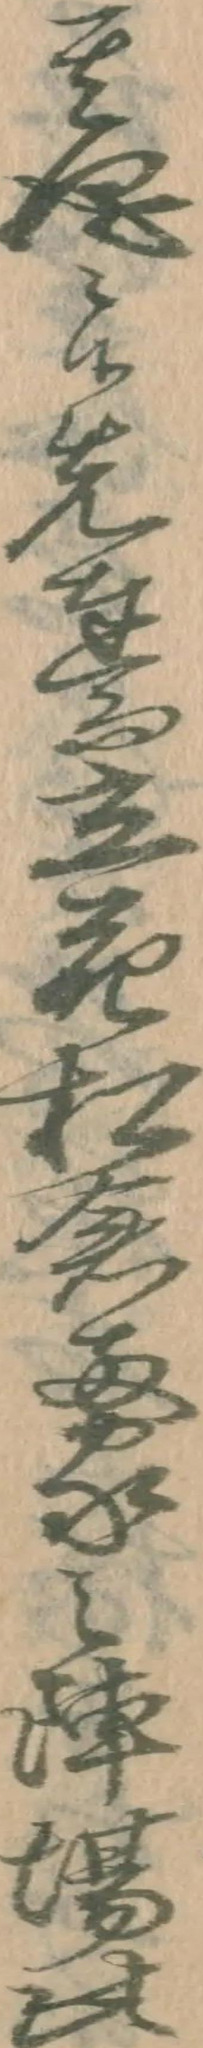其儀に候先達而立花松倉両家之陣場此
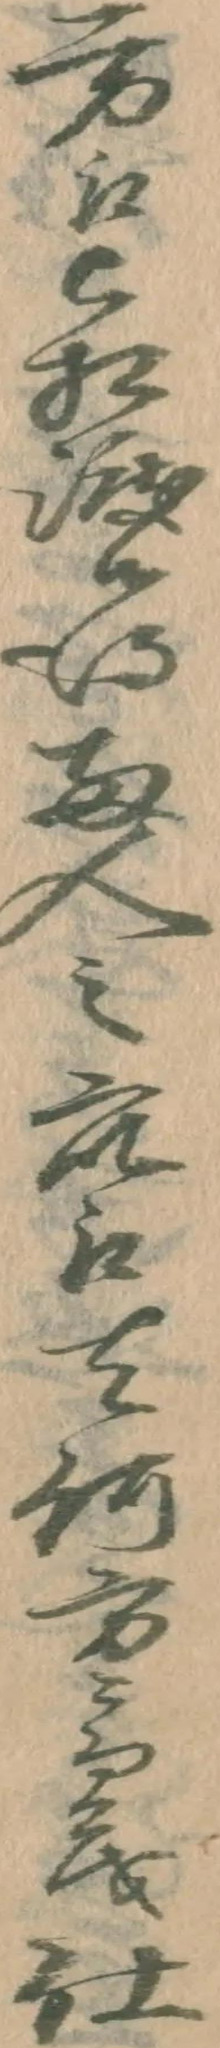方江被相渡候得両人之衆江者何方に而茂仕
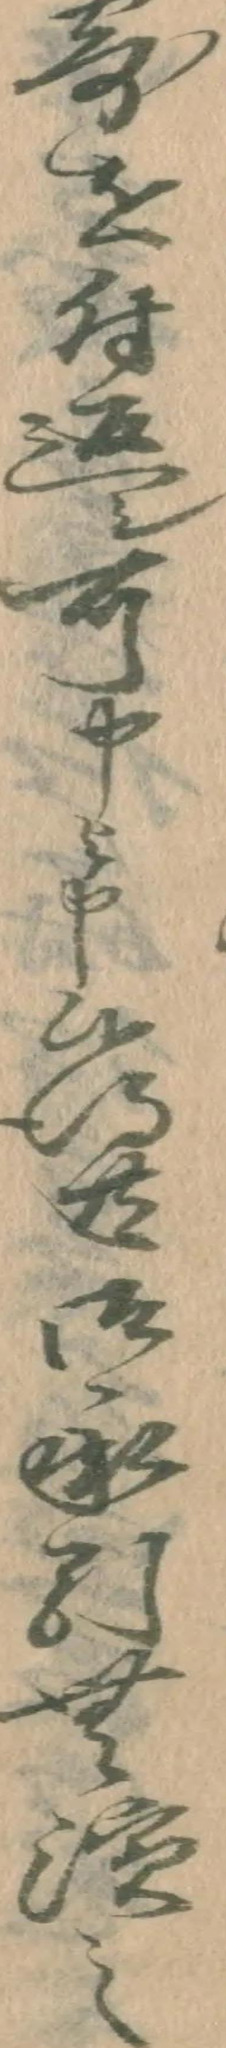寄を付返し可申与申候得共御承引無浜之
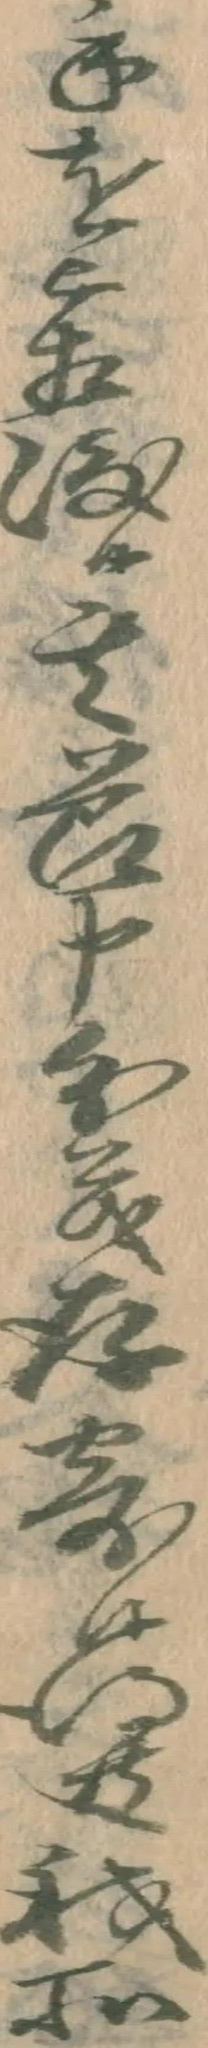手を被相渡候其節申分義存寄候得共我所
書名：切支丹御退治記 49巻. [8]
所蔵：国立国会図書館 National Diet Library, JAPAN
